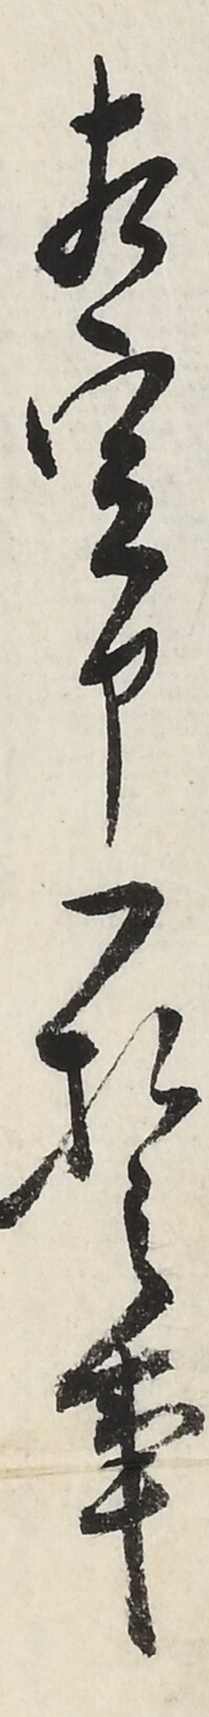相定申一札之事
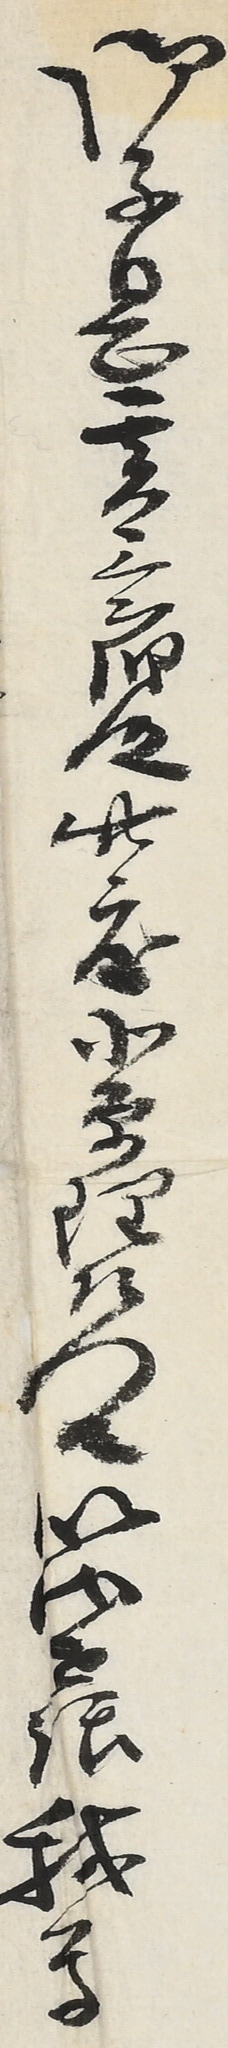御子息亥三郎殿此度北原理左衛門殿以御セ話我等
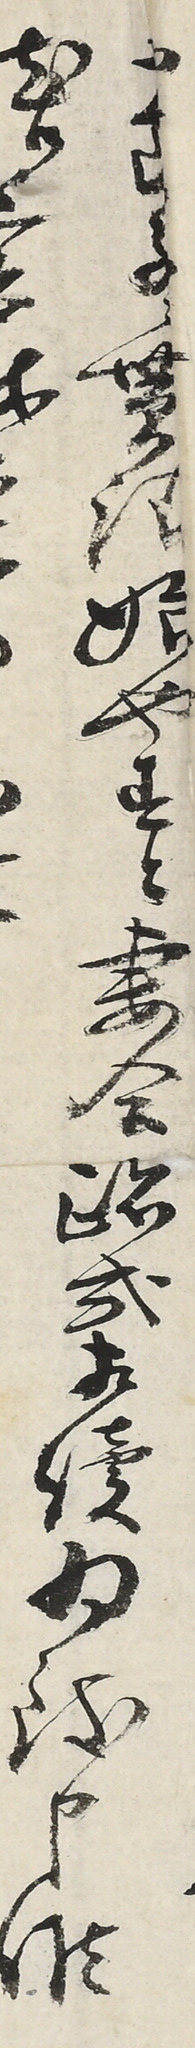養子ニ貰請娘やすと妻合跡式相続為致申候
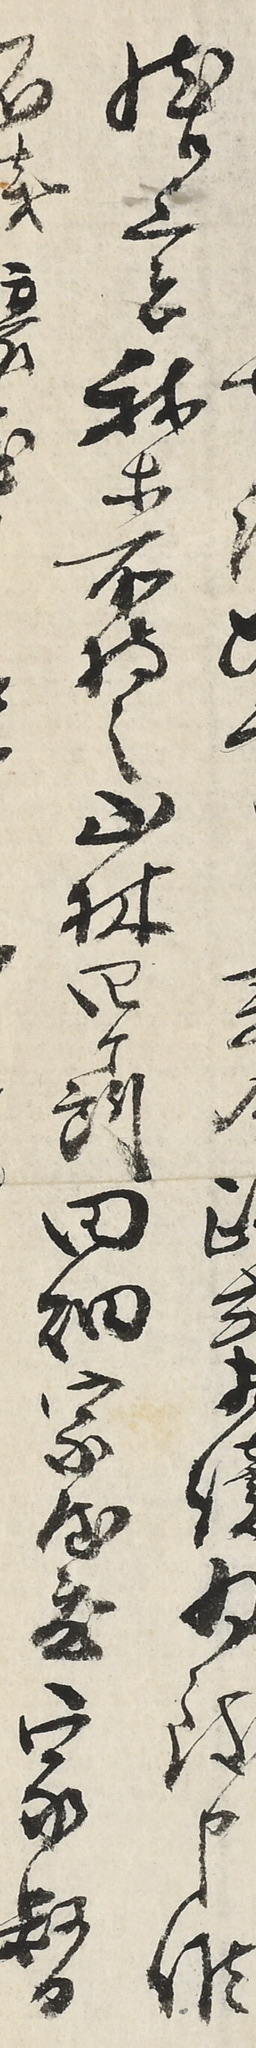然ル上者我等所持之山林四ケ所田畑家屋敷家督
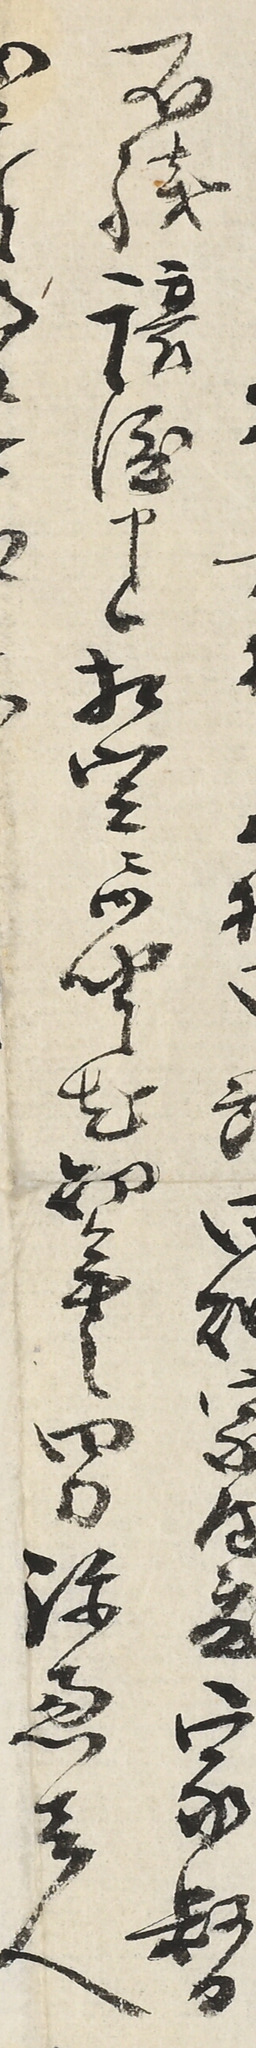不残譲渡申候相定ニ御座候尤幼年之男子弥恵壱人
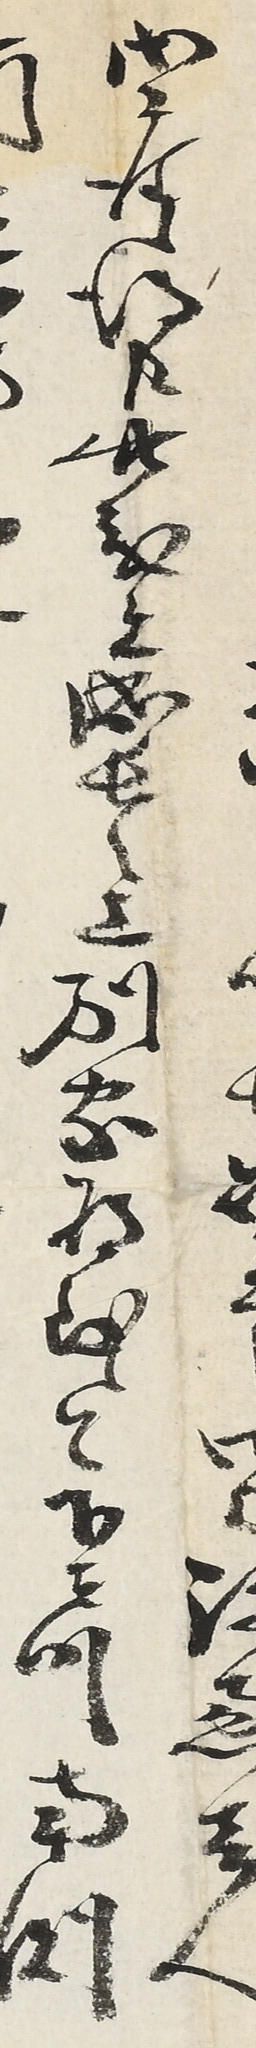御座候得共此義者成長之上別家為致候ハゝ下モ町南側
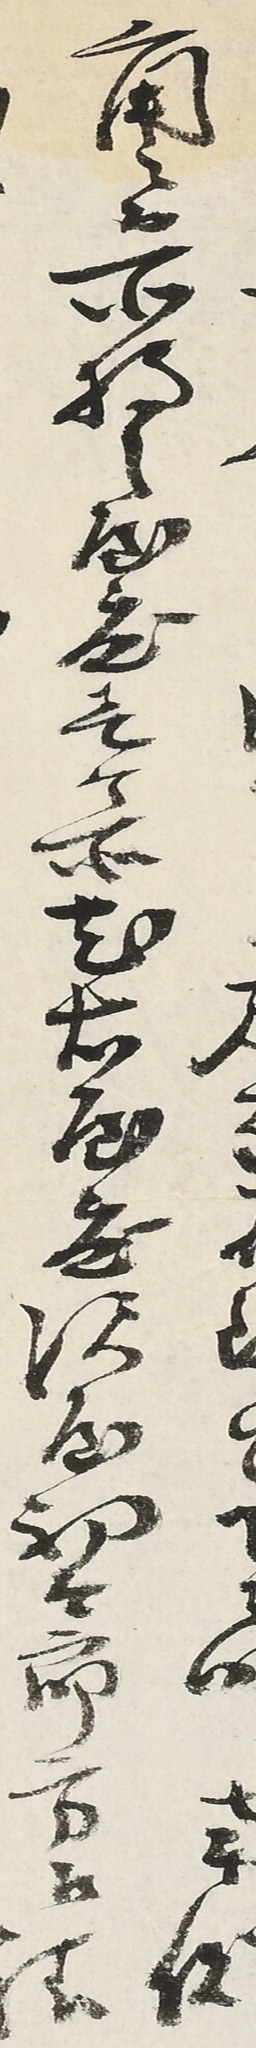角ニ而所持之屋敷壱ケ所尤右屋敷沢屋初太郎方江請
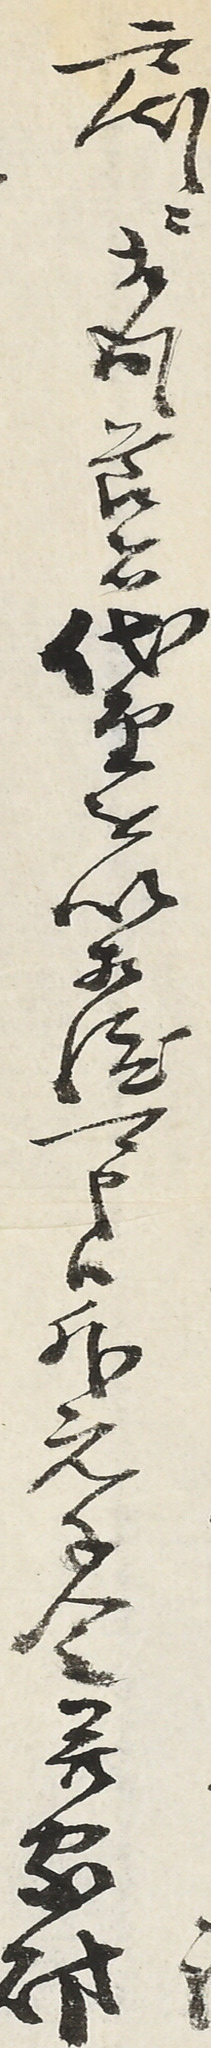戻しニ相成候節者代金を以相渡可申候外元手金幷家財
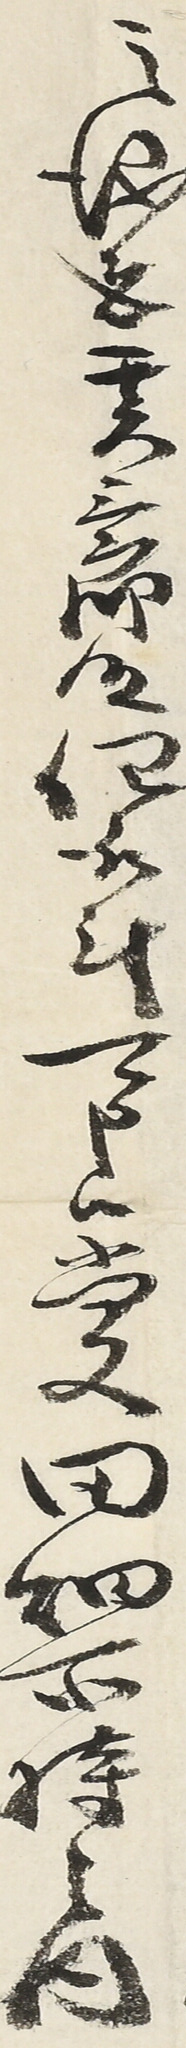之儀者亥三郎殿任取斗可申候尚又田畑所持之内
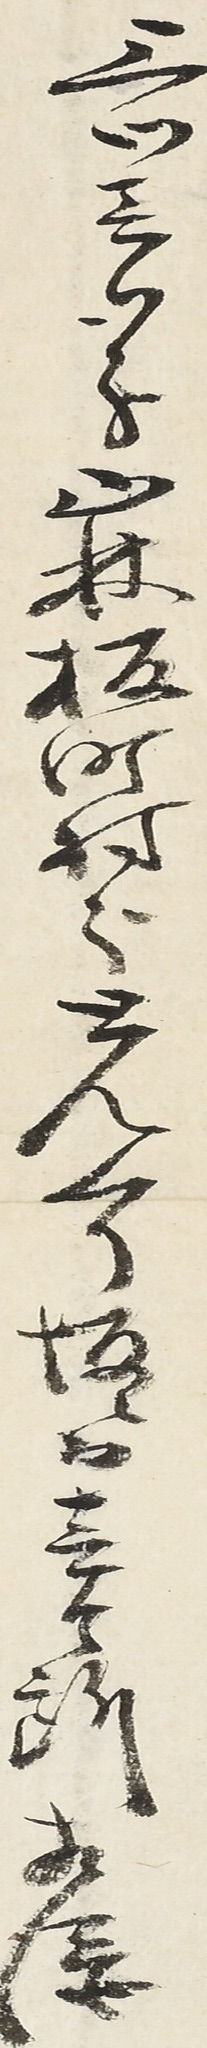三ツ壱ツ分山林板町村分とんくり坂ニ而壱ケ所相添
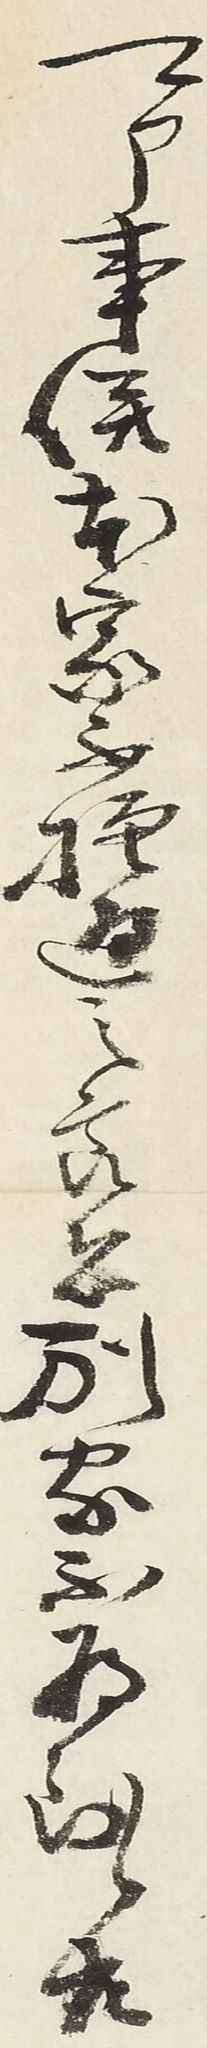可申事併本家不模通之節者別家不為致し候共
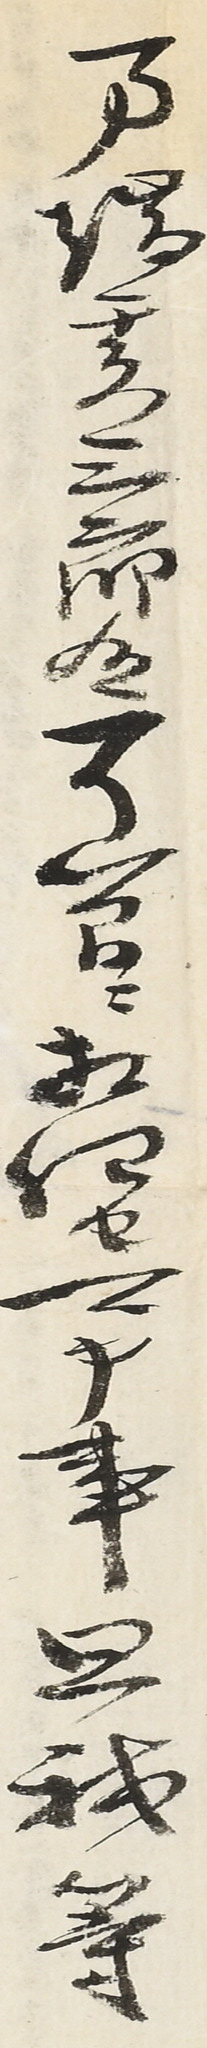万端亥三郎殿了簡ニ相任セ可申事且我等
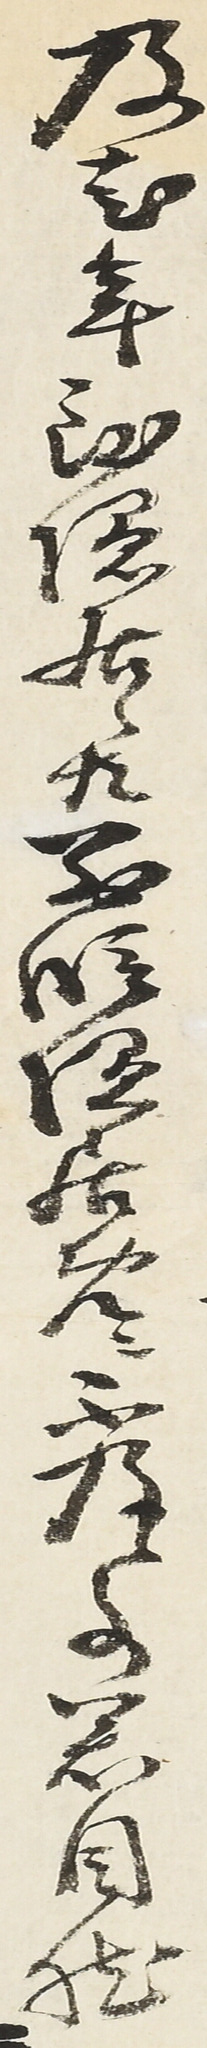及老年致隠居候共別段隠居免ニ不及候事若自然
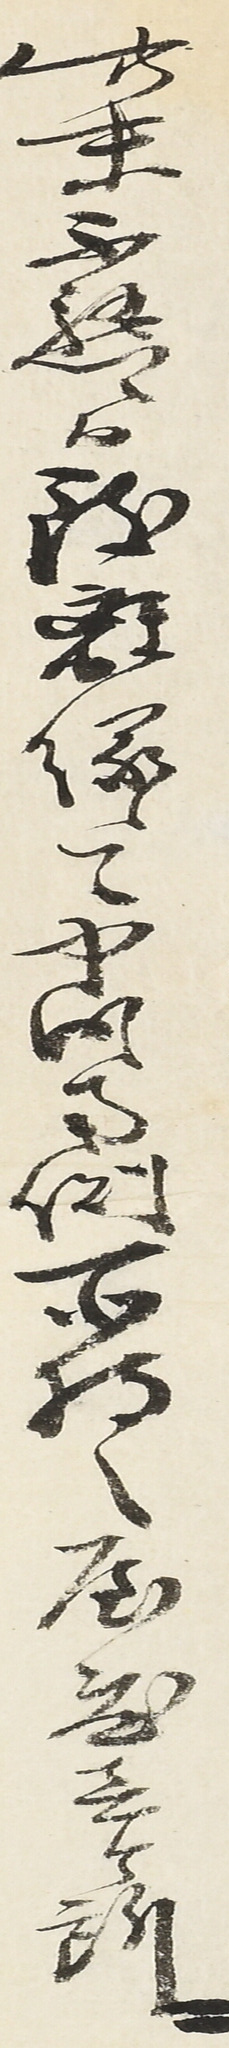此末不熟ニ而致離縁候ハゝ中町南側所持之屋敷壱ケ所ニ
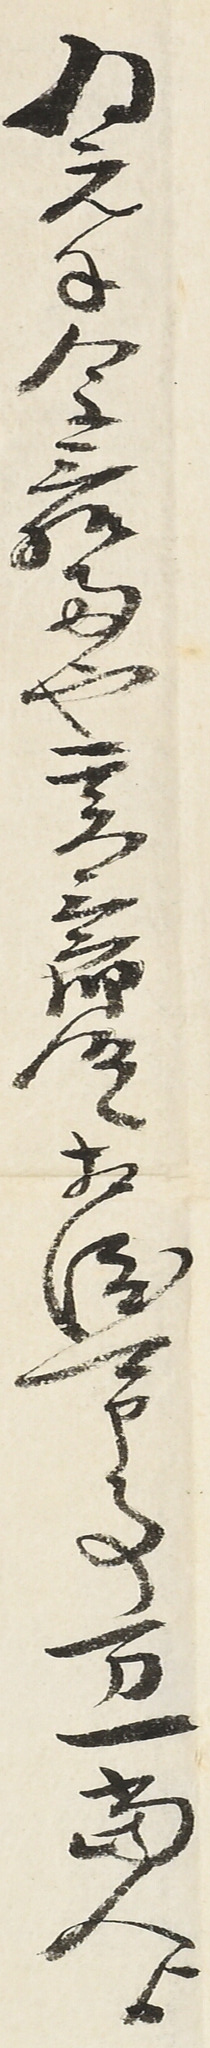為元手金三拾両也亥三郎殿へ相渡可申事万一当人ゟ
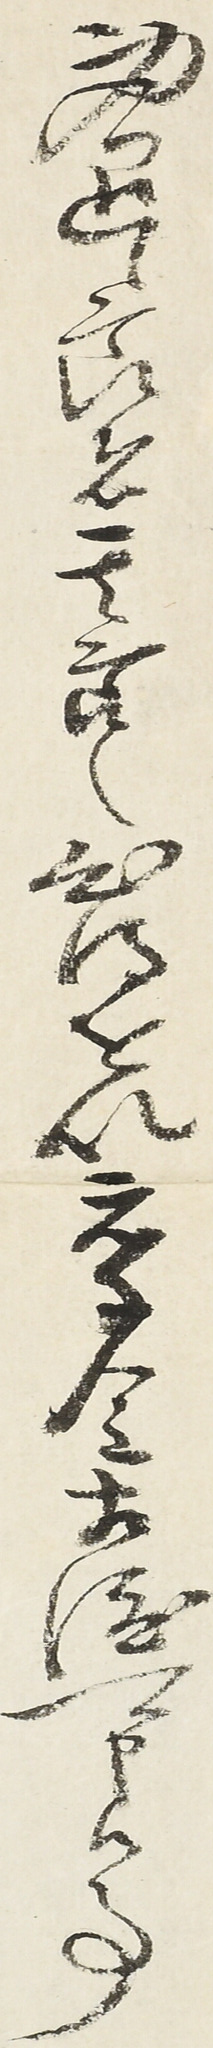身退候節者其節之心得を以元手金相渡可申事
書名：相定申一札之事
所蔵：伊那市立高遠町図書館・合同会社AMANE
